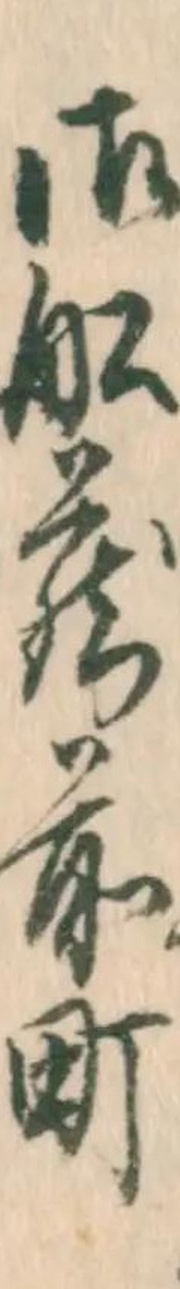御船蔵前町
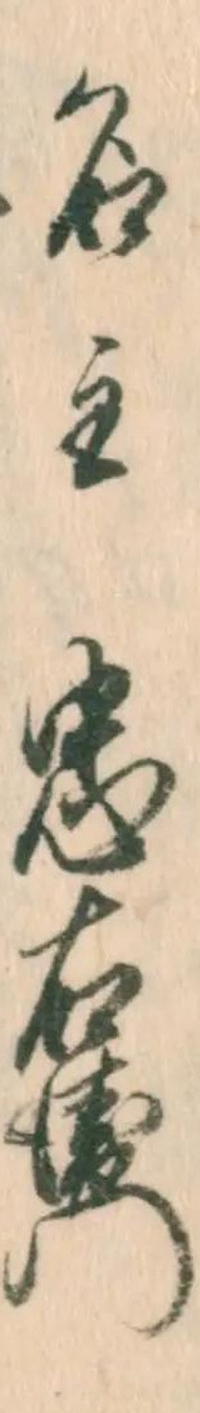名主忠右衛門
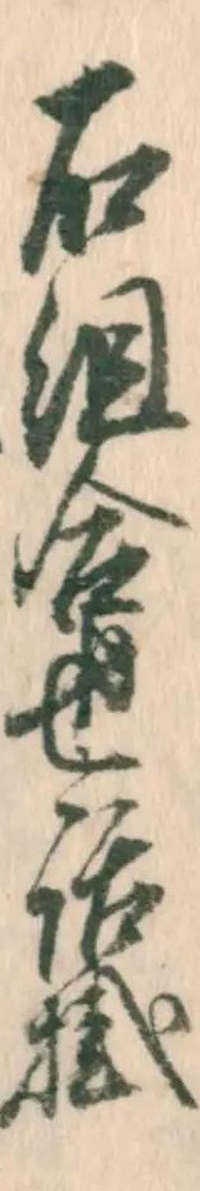右組合世話掛
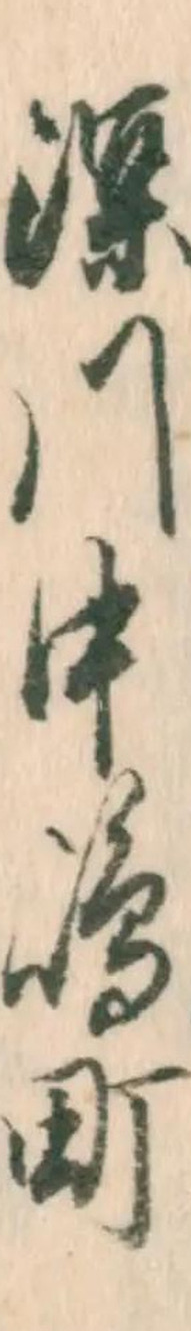深川中島町
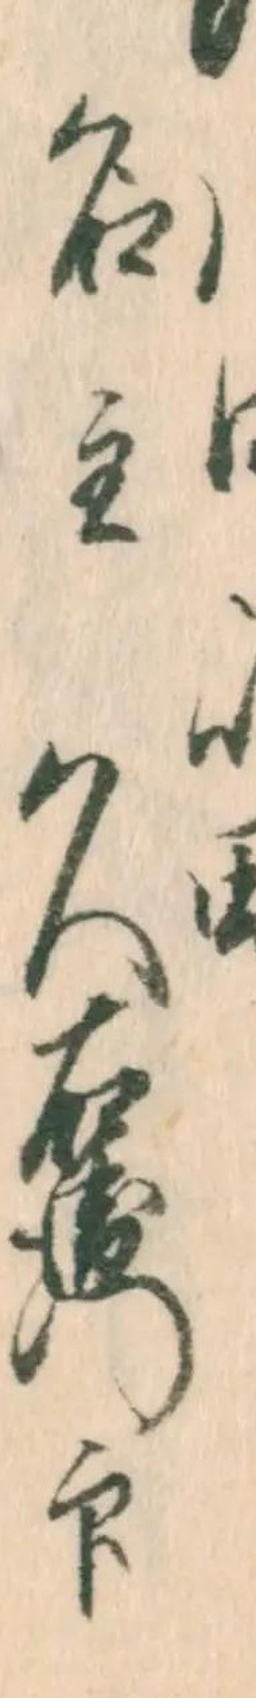名主久右衛門印
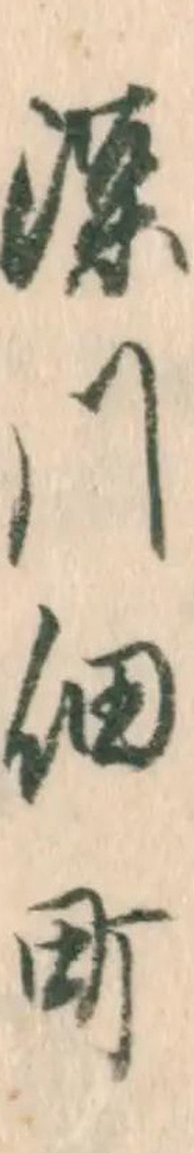深川佃町
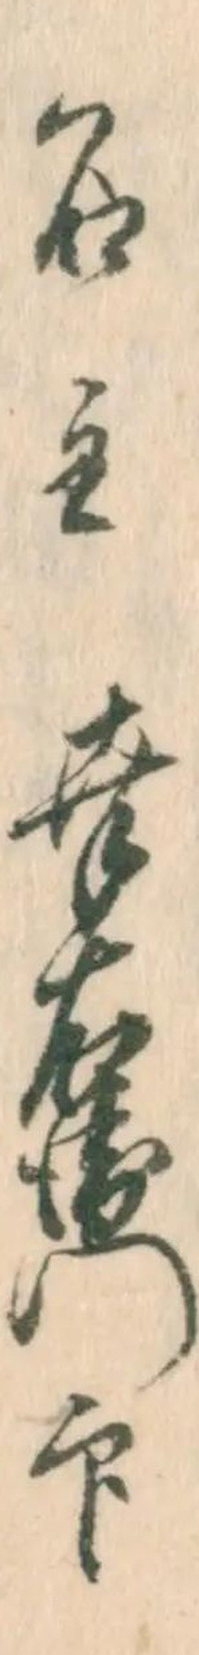名主幸右衛門印
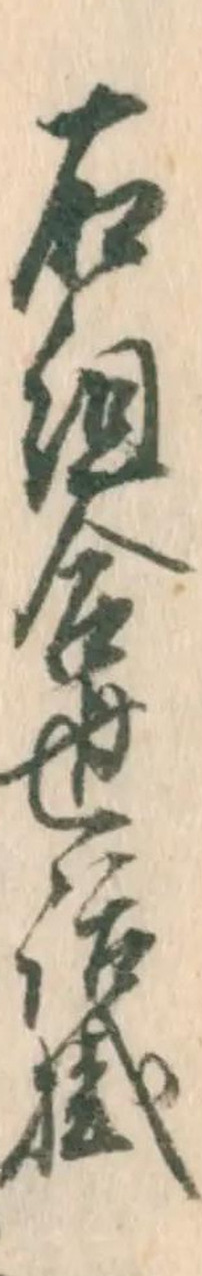右組合世話掛
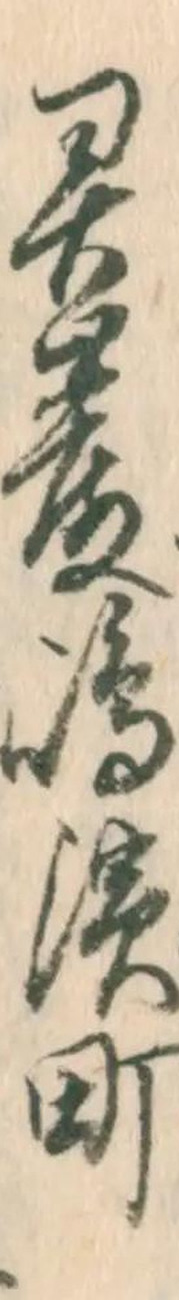霊厳島浜町
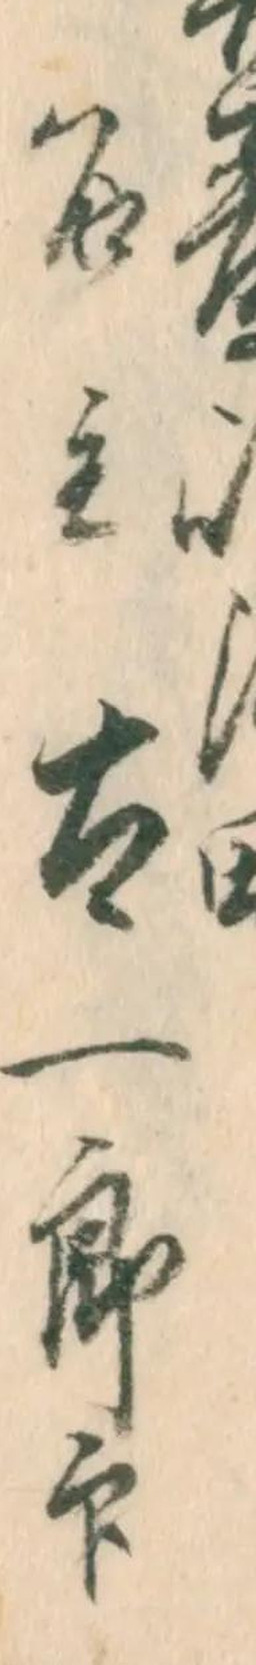名主太一郎印【

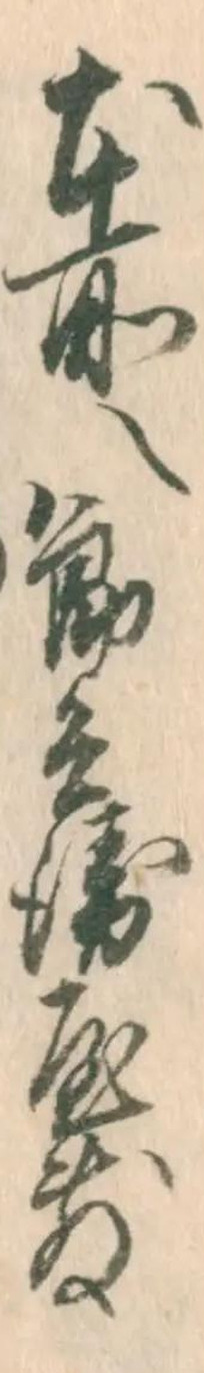本所八郎兵衛屋敷
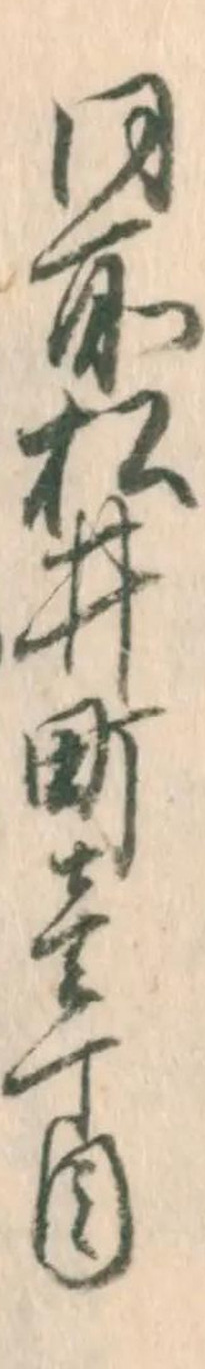同所松井町壱丁目
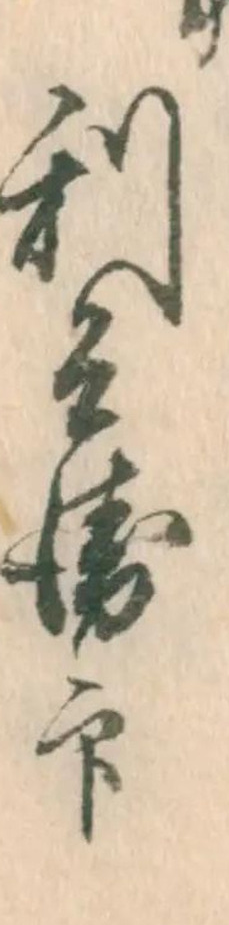月行事利兵衛印
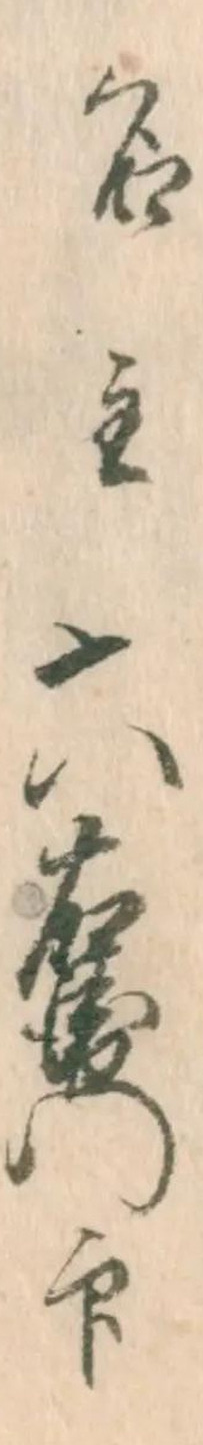名主六右衛門印
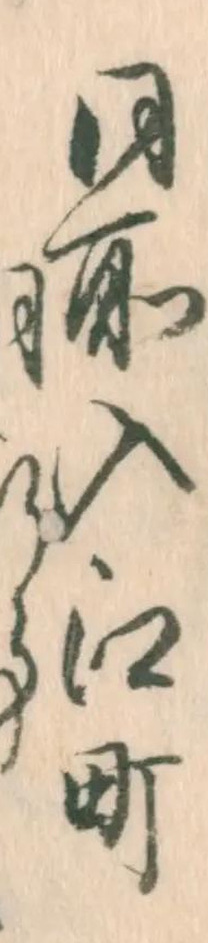同所入江町
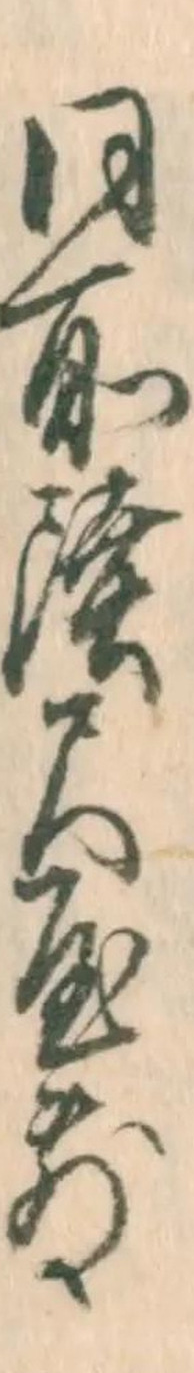同所陸尺屋敷
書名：地震災書留 2巻. [2] 内表紙に「地震一件　安政二卯年十月」とあり
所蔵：国立国会図書館 National Diet Library, JAPAN
